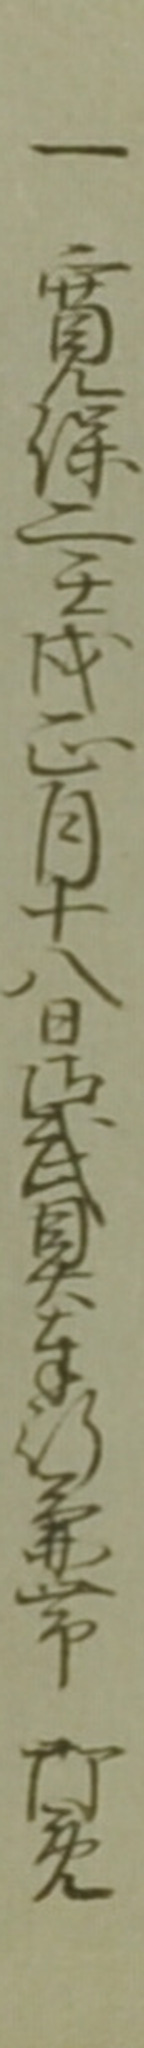一寛保二壬戌正月十八日御武具奉行兼帯御免
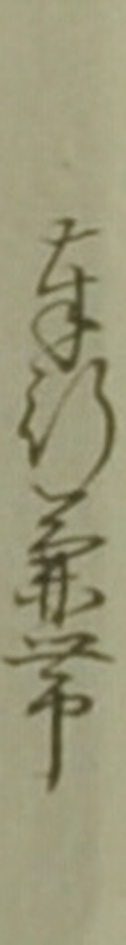奉行兼帯
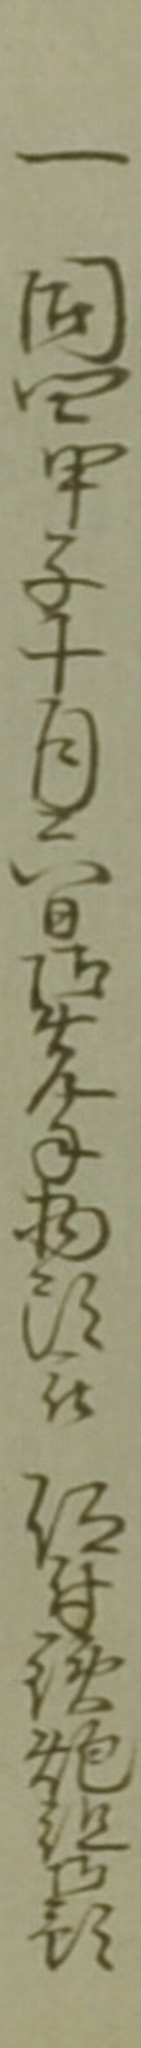一同四甲子十月六日御先手物頭被仰付鉄炮組御預
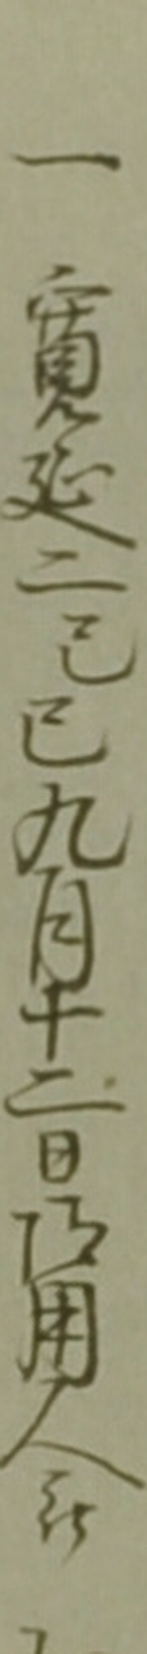一寛延二己巳九月十二日御用人被仰付
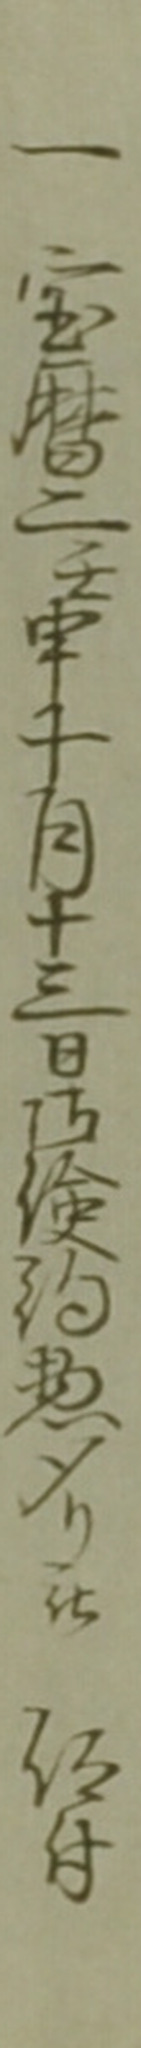一宝暦二壬申十月十三日御倹約惣〆り被仰付
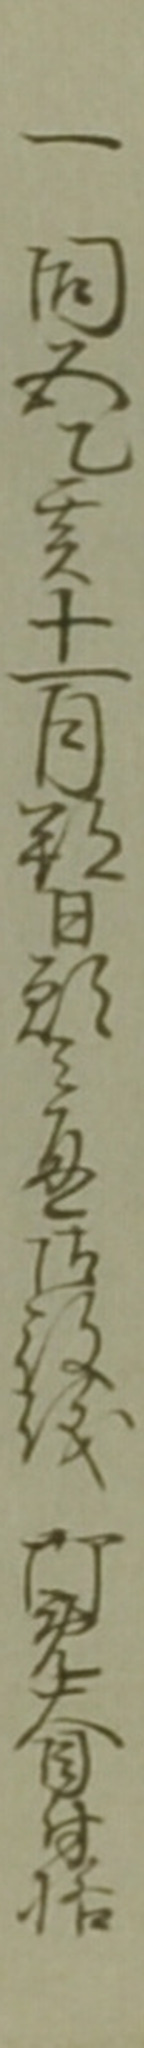一同五乙亥十一月朔日願之通御役儀御免大目付格
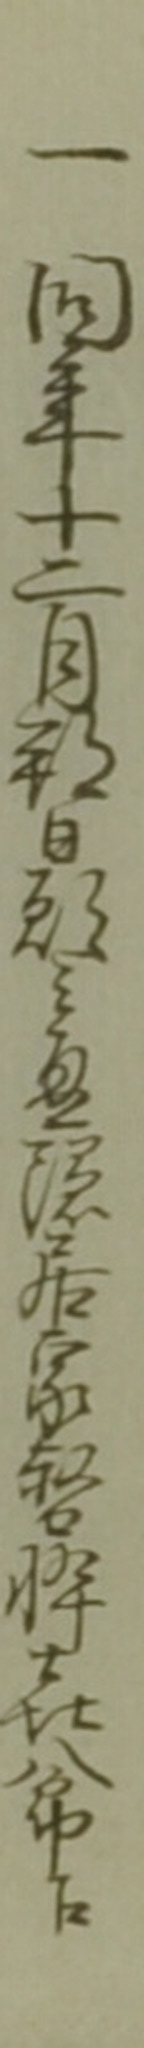一同年十二月朔日願之通隠居家督忰喜八郎え
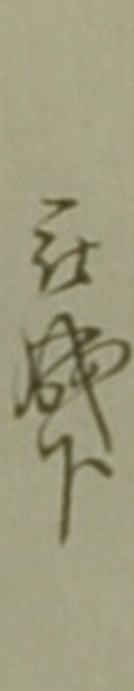被成下
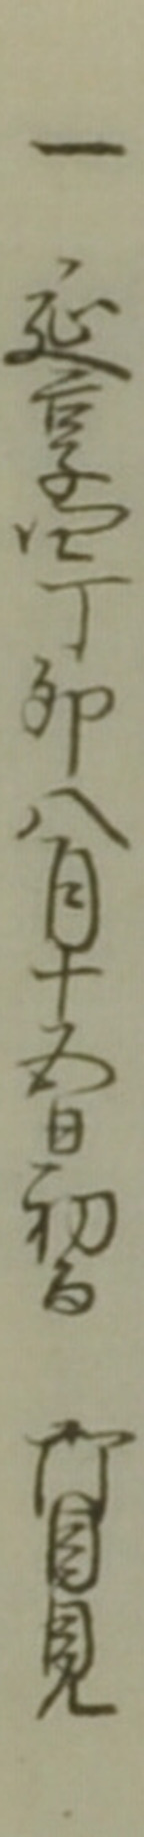一延享四丁卯八月十五日初而御目見
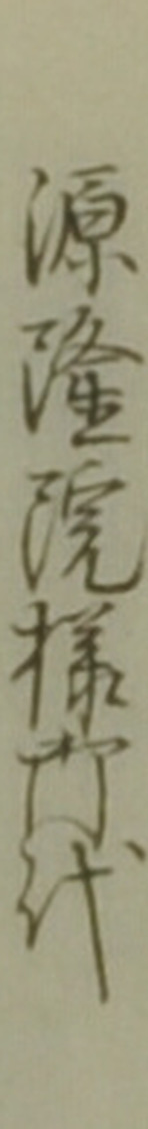源隆院様御代
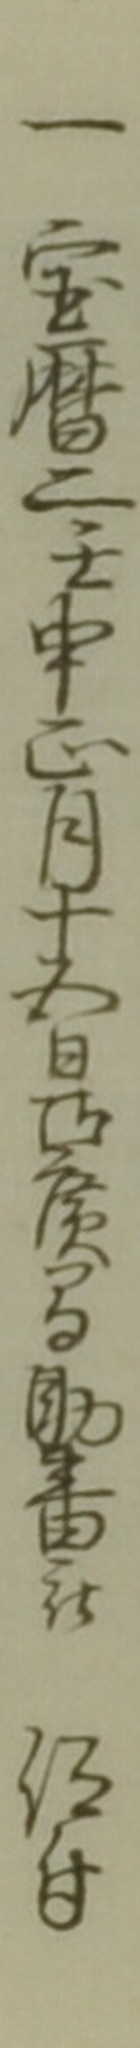一宝暦二壬申正月十五日御広間助番被仰付
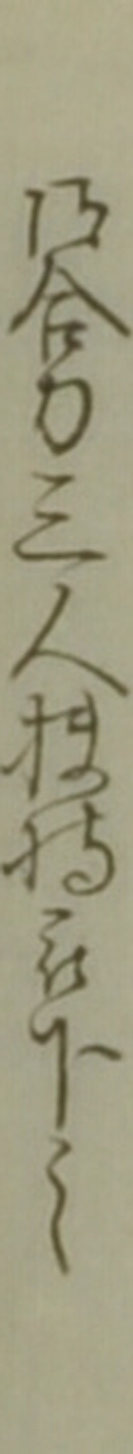御合力三人扶持被下之
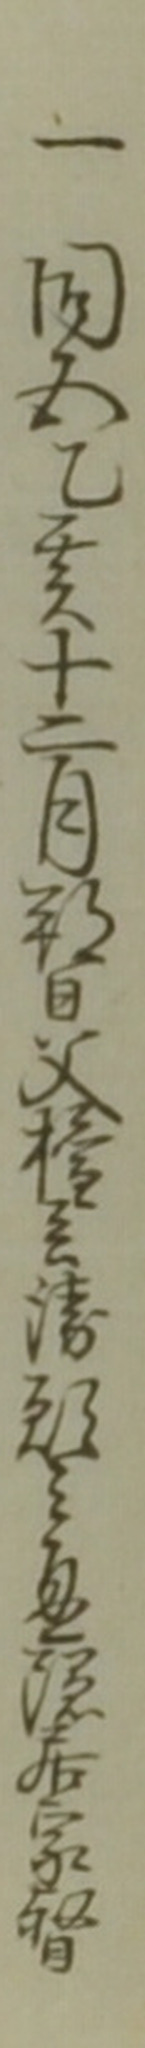一同五乙亥十二月朔日父権兵衛願之通隠居家督
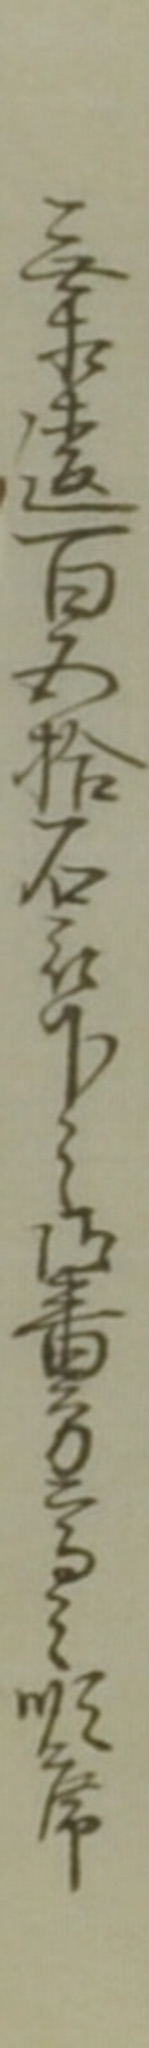無相違百五拾石被下之御番方高之順席
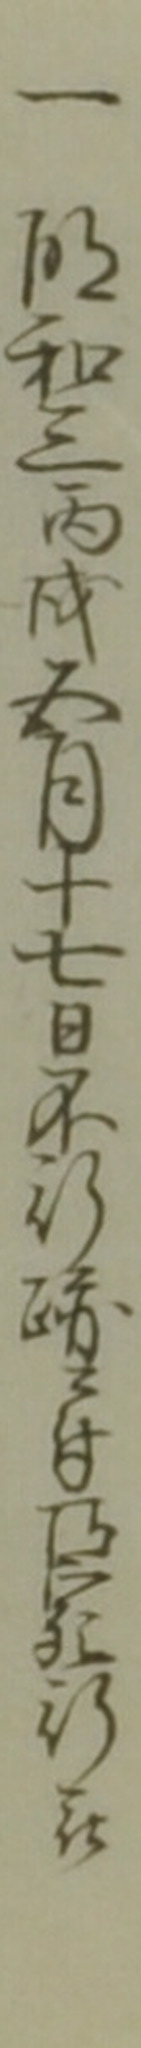一明和三丙戌五月十七日不行跡ニ付御宛行被
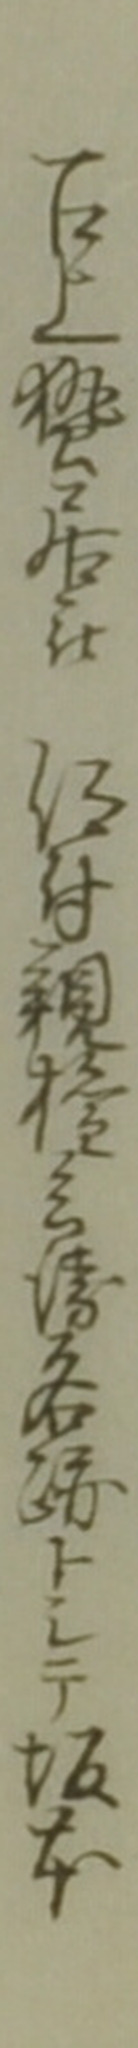召上蟄居被仰付親権兵衛名跡トシテ坂本
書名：給人諸士勤仕録（三）
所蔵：伊那市立高遠町図書館・合同会社AMANE
